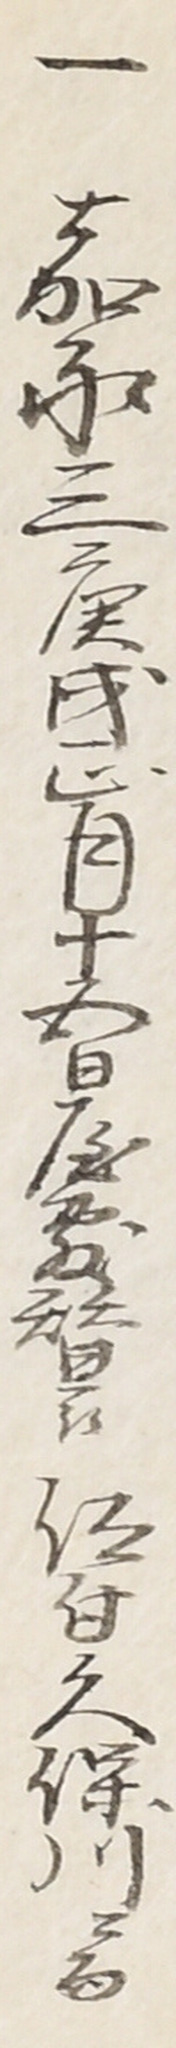一嘉永三庚戌正月十五日屋敷替被仰付久保川ニ而
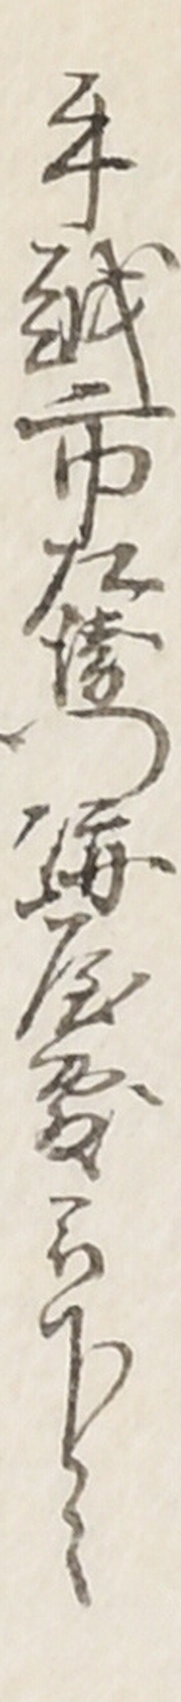手越市左衛門跡屋敷被下之
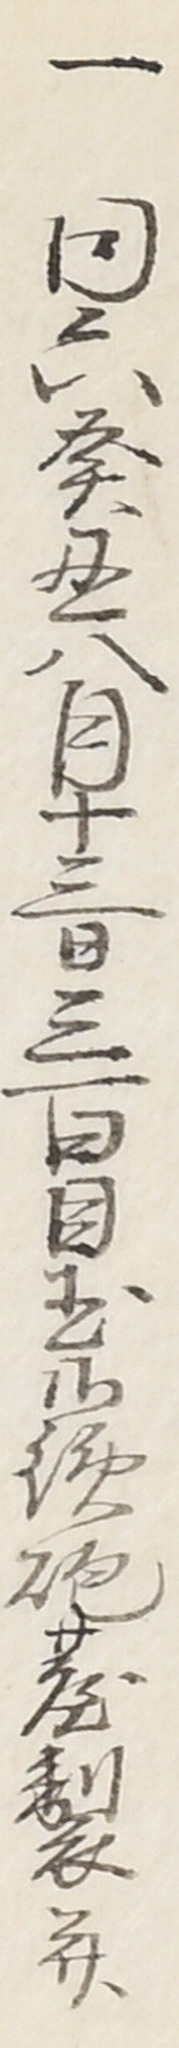一同六癸丑八月十三日三百目玉御鉄砲台製并
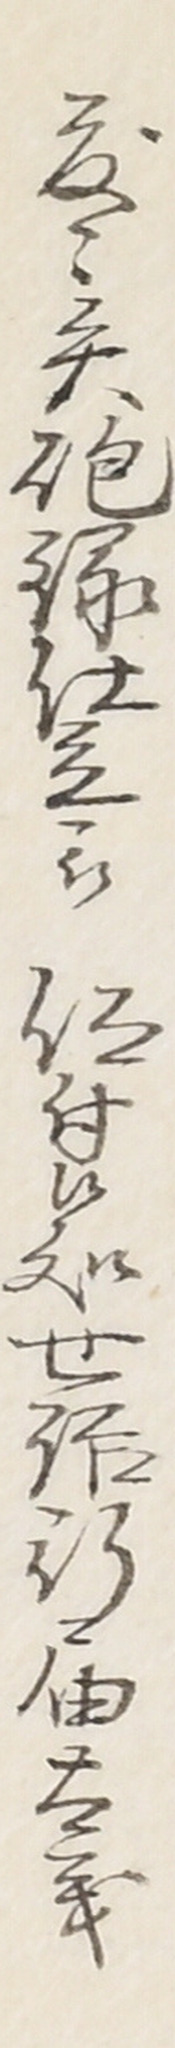度々矢砲録仕立被仰付候処世話行届太義
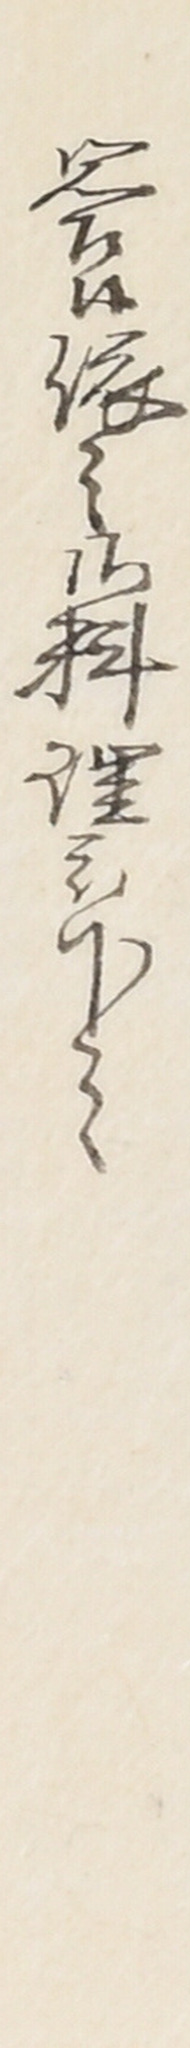思召候依之御料理被下之
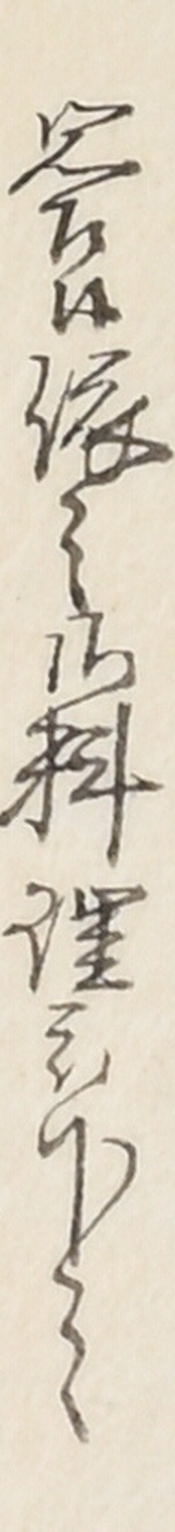思召候依之御料理被下之
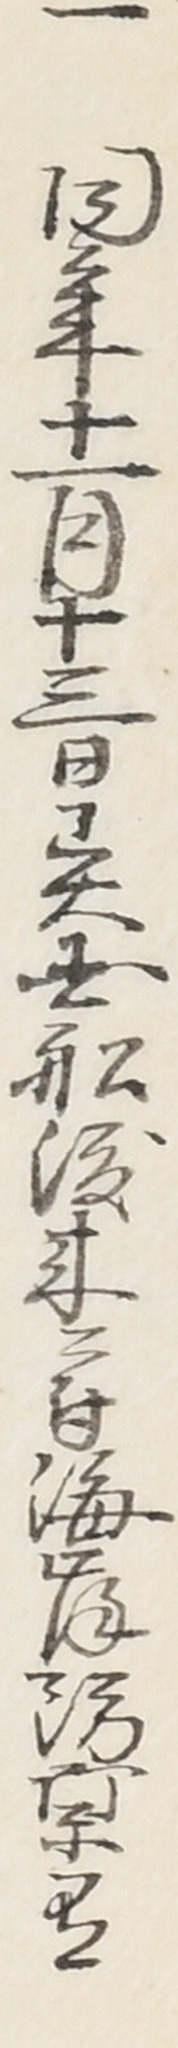一同年十一月十三日異国船渡来ニ付海岸防禦有
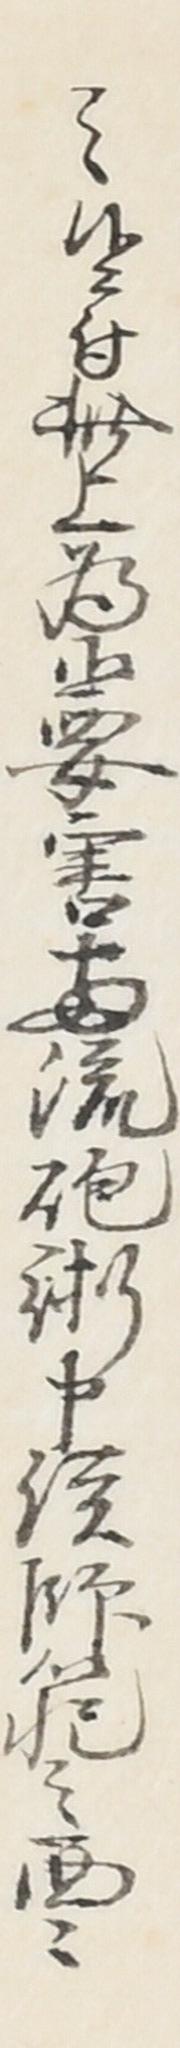之候ニ付此上為御要害両流砲術申談師範之面々
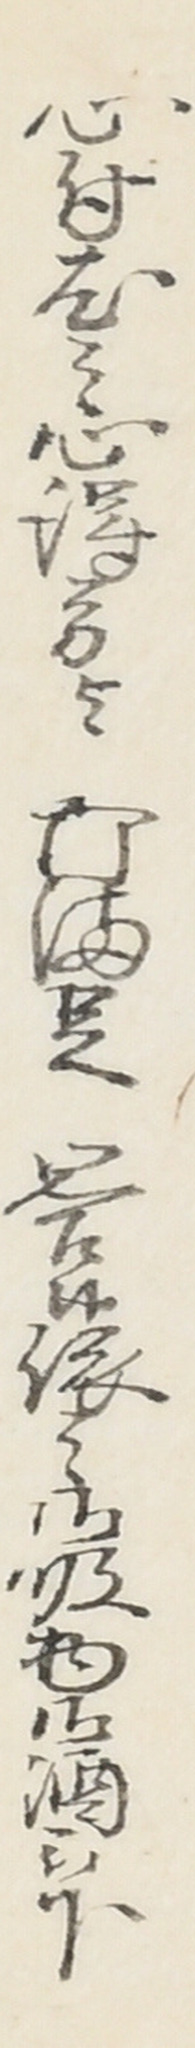心付尤之心得方与御満足思召候依之御吸物御酒被下
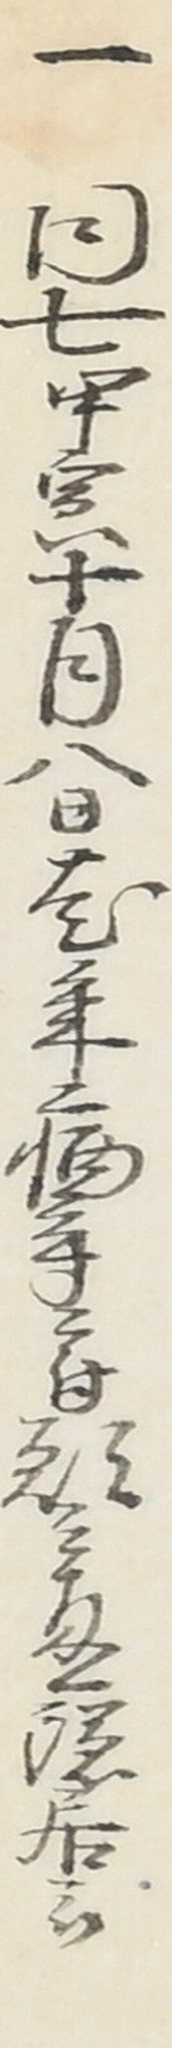一同七甲寅十月八日老年病気ニ付願之通隠居被
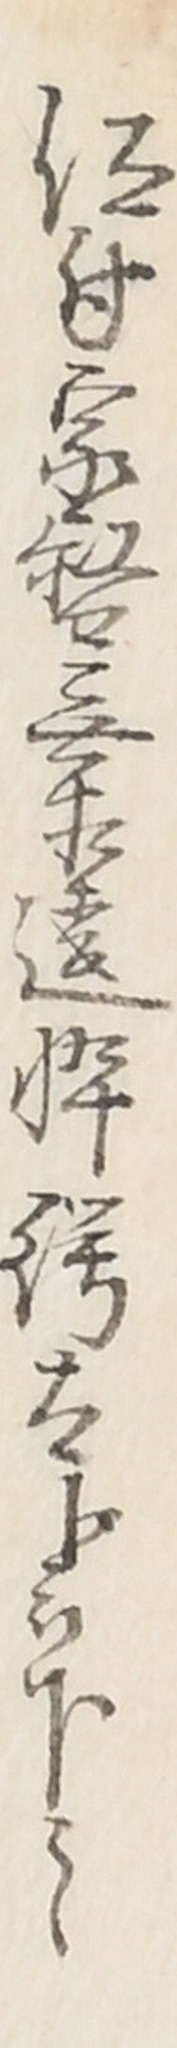仰付家督無相違伜鍔太江被下之
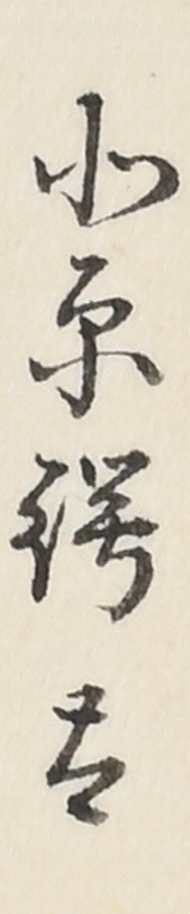北原鍔太
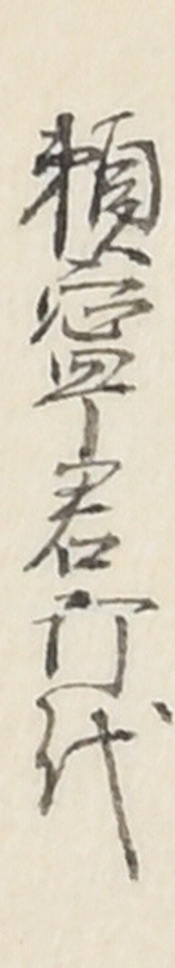頼寧君御代
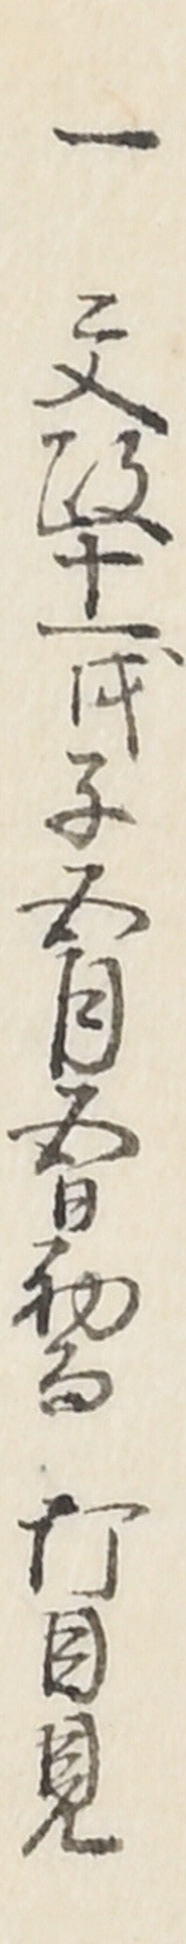一文政十一戌子五月五日初而御目見
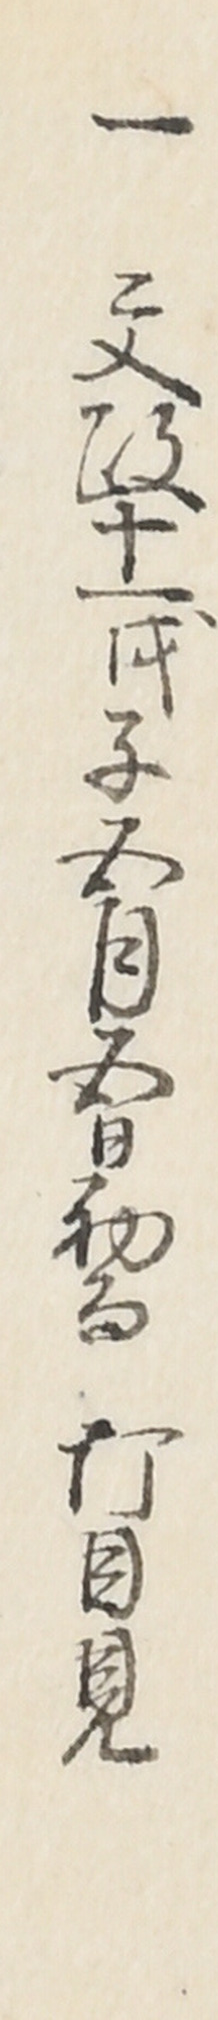一文政十一戌子五月五日初而御目見
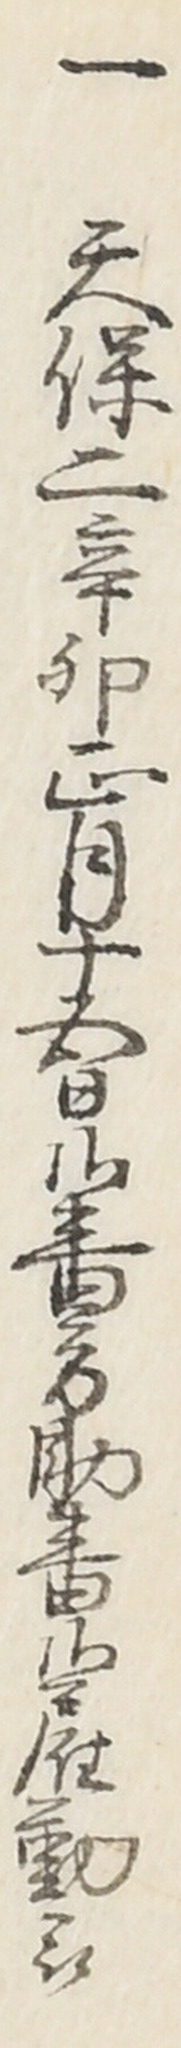一天保二辛卯正月十五日御番方助番御雇勤被
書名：給人諸士勤仕録（七）
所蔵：伊那市立高遠町図書館・合同会社AMANE
